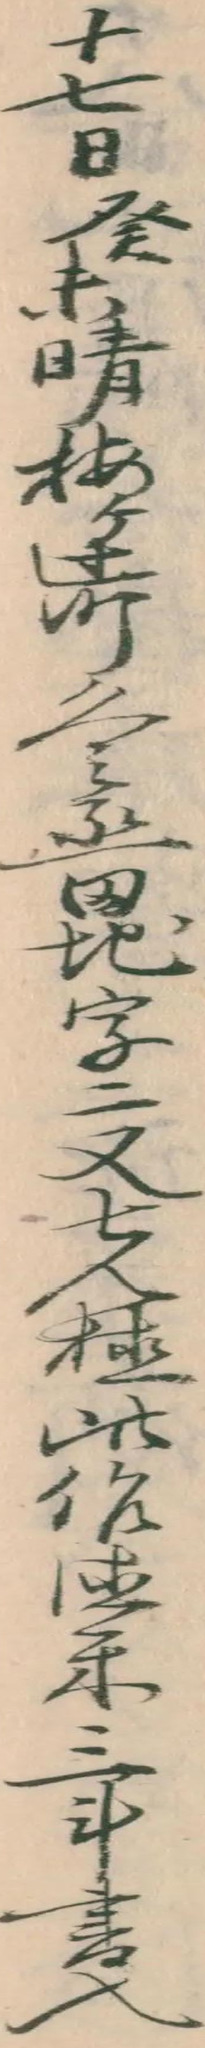十七日癸未晴梅ヶ崎町久之丞田地字二又七人植此作徳米三斗書入
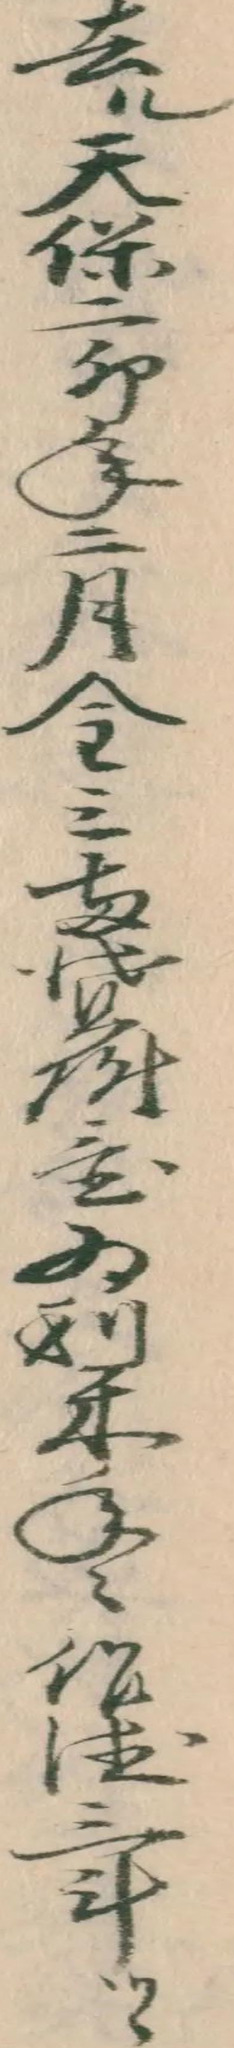去ル天保二卯年二月金三両貸附置為利米年々作徳三斗ツヽ
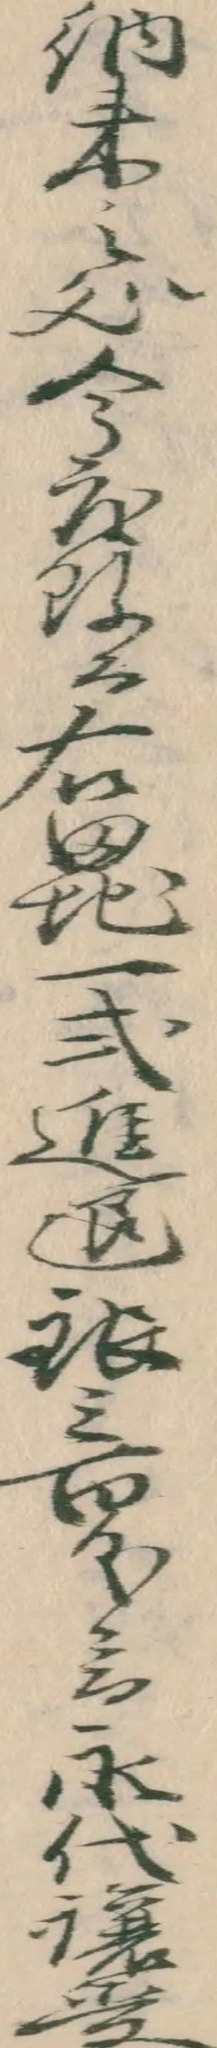納来之処今度改而右田地一式進退銀三百匁ニ而永代譲受
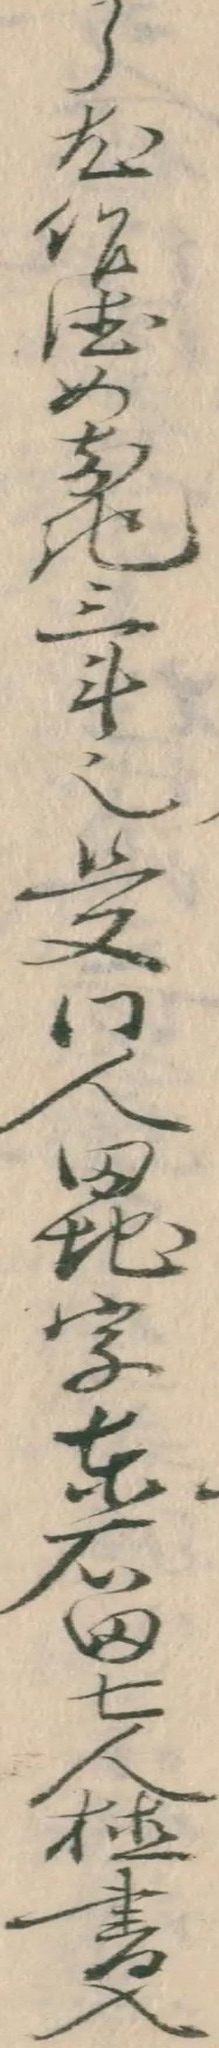了尤作徳如前記三斗也且又同人田地字東石田七人植書入
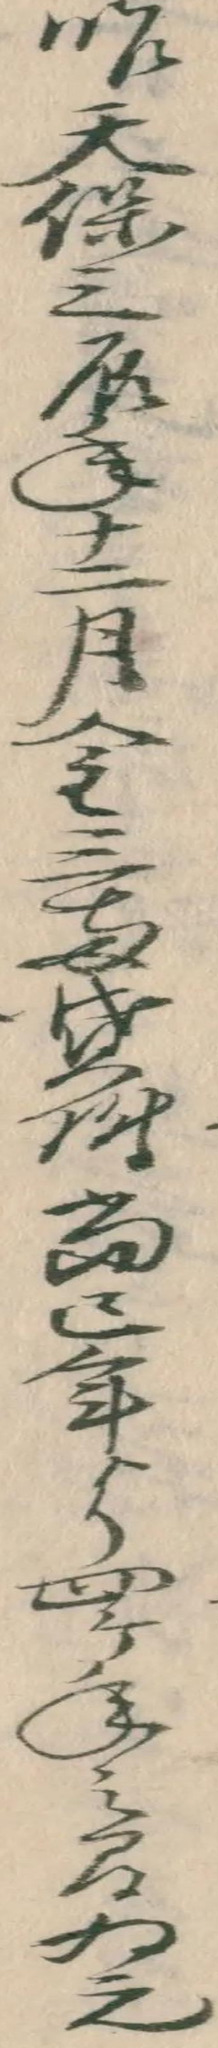昨天保三辰年十二月金三両貸附當巳年より四ヶ年之間為元
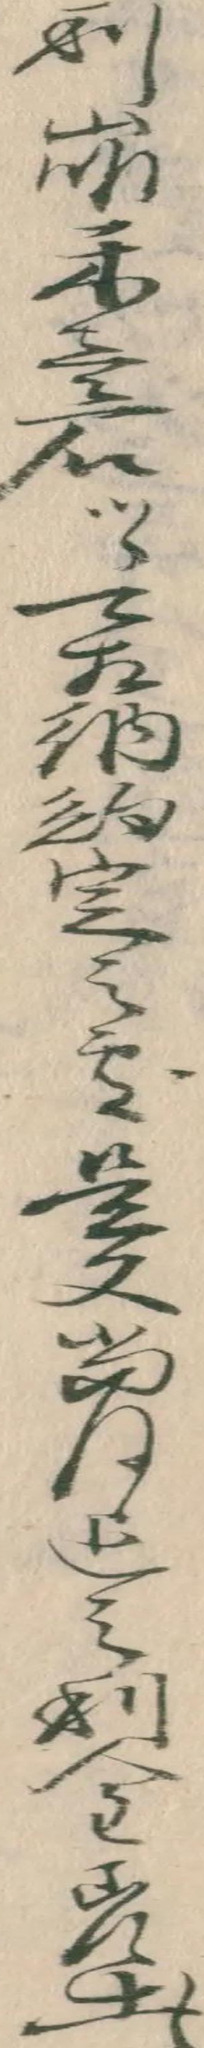利崩米壱石ツヽ可相納約定之處是又當月迄之利金差出し
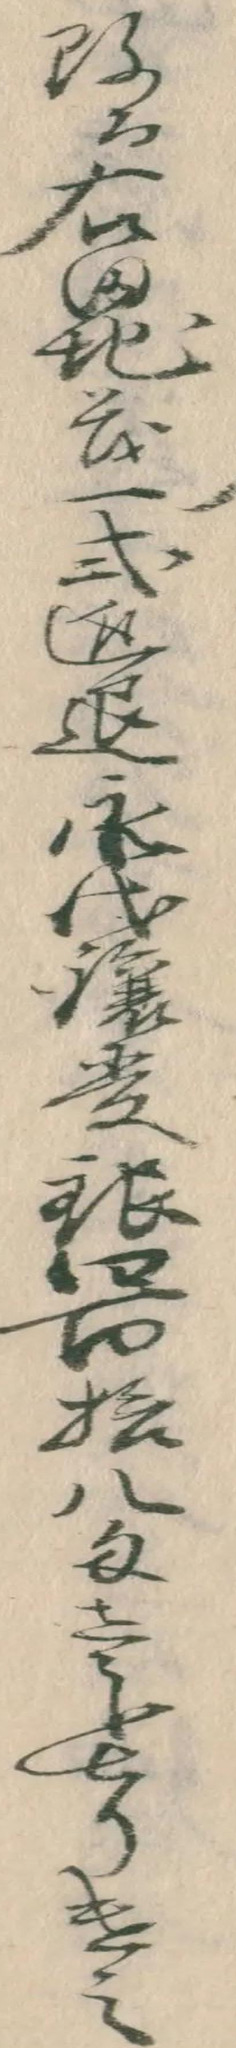改而右田地も一式進退永代譲麦銀四百拾八匁壱分七り遣之
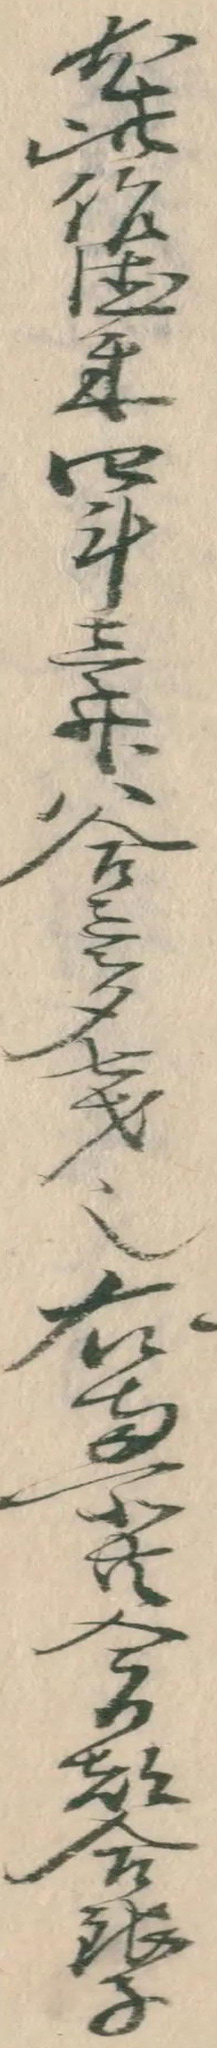尤此作徳米四斗壱升八合三勺七才也右両所共今日都合銀子
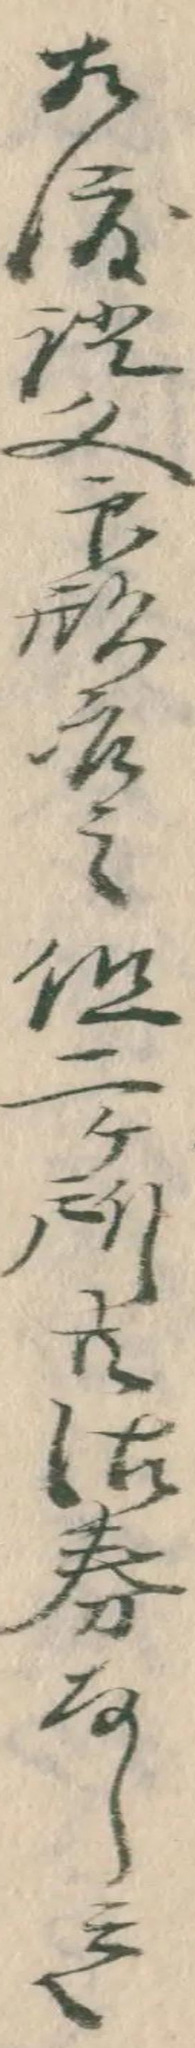相渡證文印形取之但二ケ所共沽券なし云々
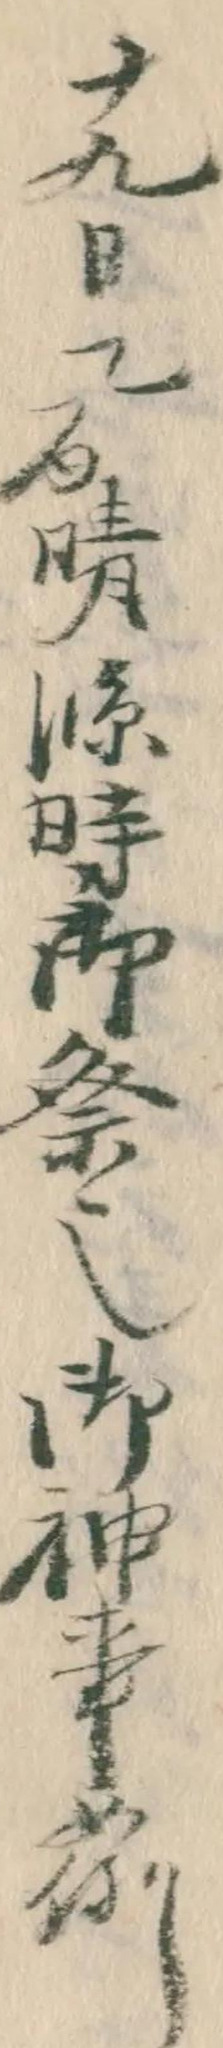十九日乙酉晴臨時御祭也御神事ニ如例
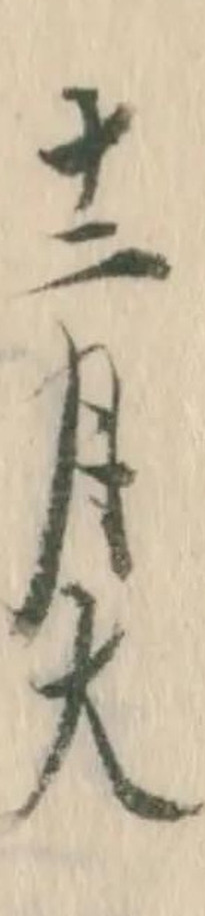十二月大
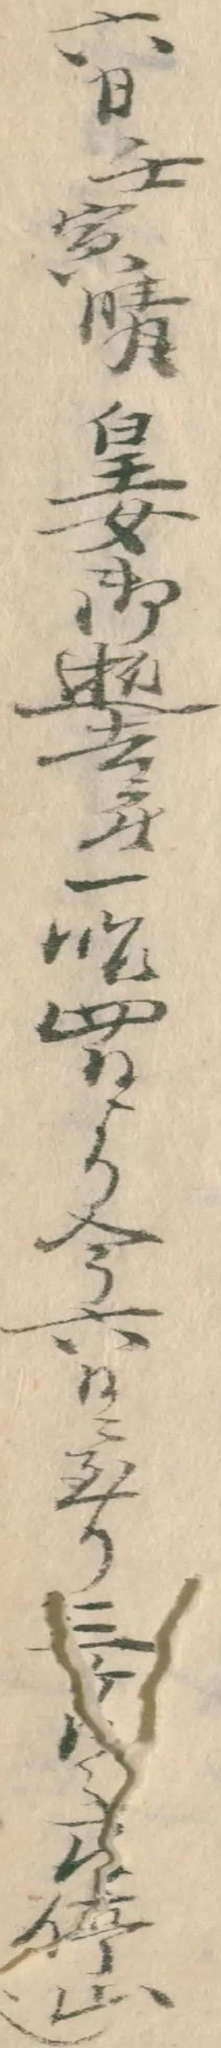六日壬寅晴皇女御逝去ニ付一昨四日より今六日ニ至り三ケ月之間停山也

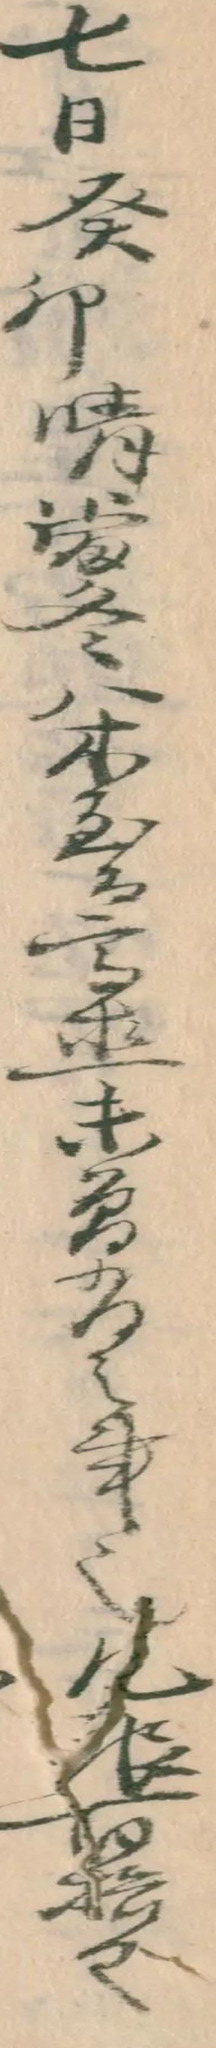七日癸卯晴當冬八木屋而高直未曾有之事也凡銀百拾匁之
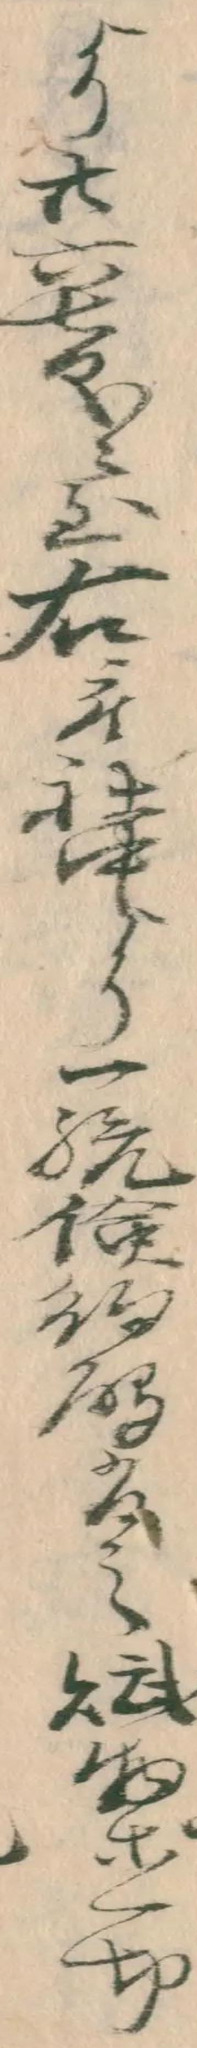より廿六七匁二至右二付社中より一統倹約觸有之賦物等一切
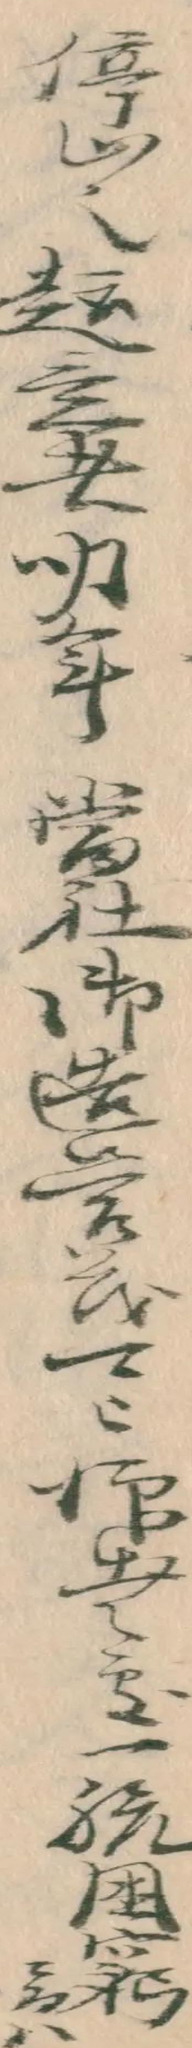停止之趣意は明年當社御造営も可被仰出候処一統困窮ニ而ハ
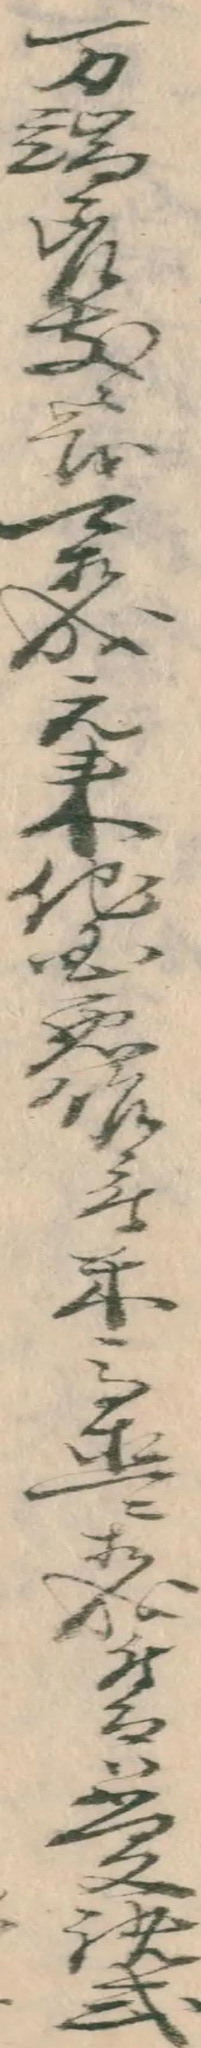万端差支ニも可相成元来他国悪作ニ付米高直ニ相成ニ付而ハ尚又諸武
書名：賀茂社記録. 第66冊
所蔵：国立国会図書館 National Diet Library, JAPAN
